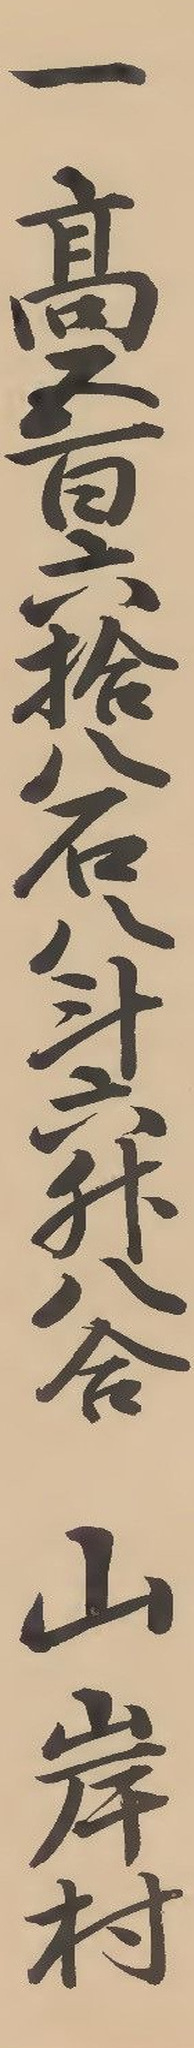一高五百六拾八石八斗六升八合山岸村
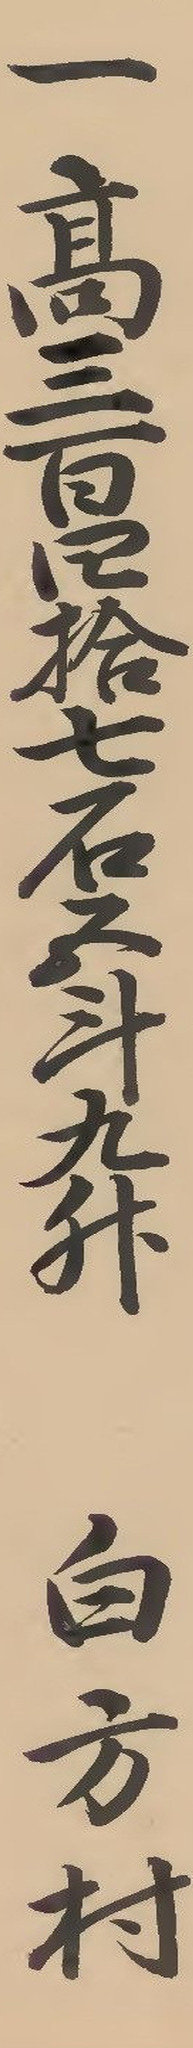一高三百四拾七石五斗九升白方村

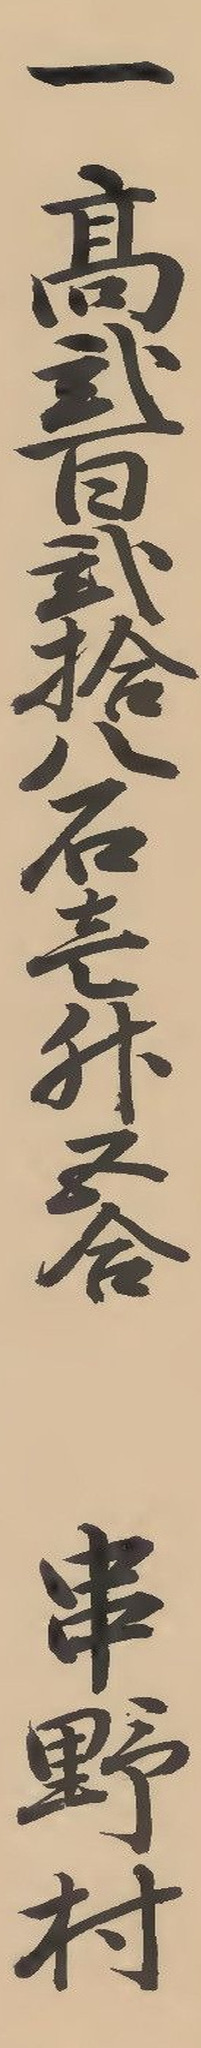一高弐百弐拾八石壱升五合串野村
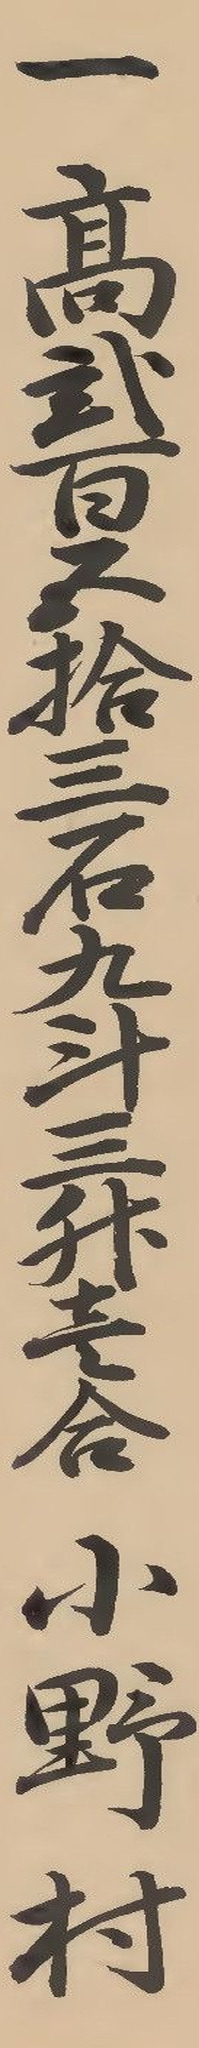一高弐百五拾三石九斗三升壱合小野村
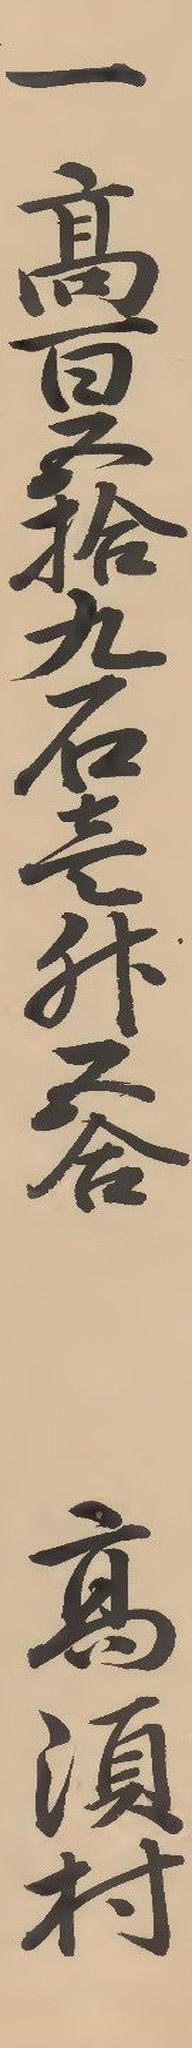一高百五拾九石壱升五合高須村
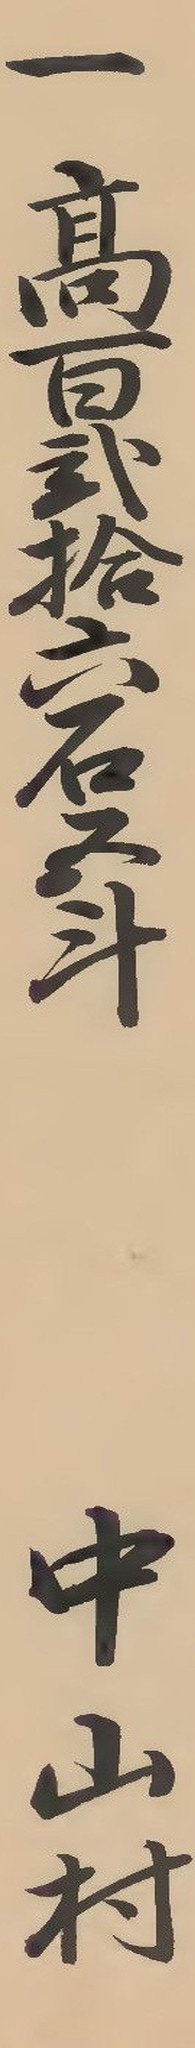一高百弐拾六石五斗中山村

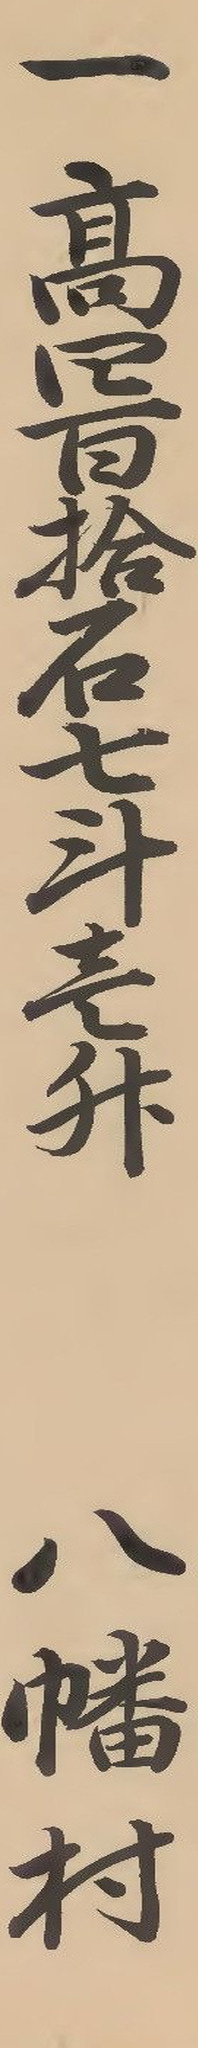一高四百拾石七斗壱升八幡村
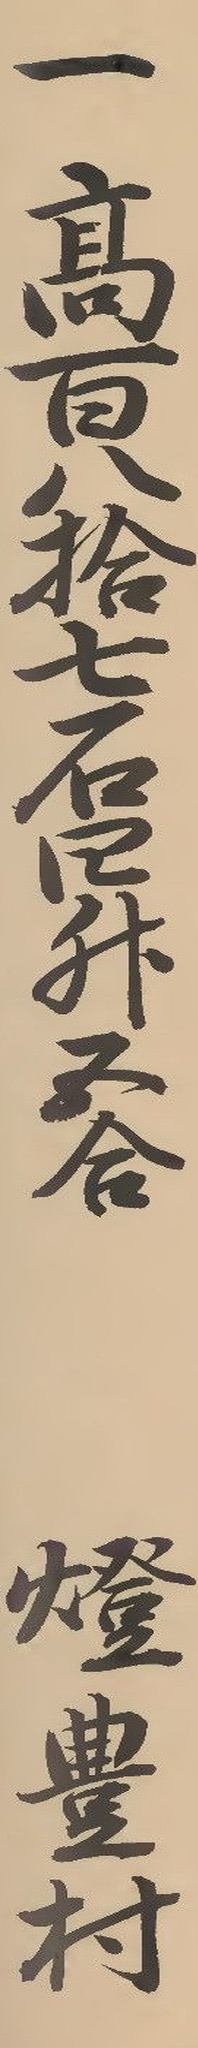一高百八拾七石四升五合灯豊村
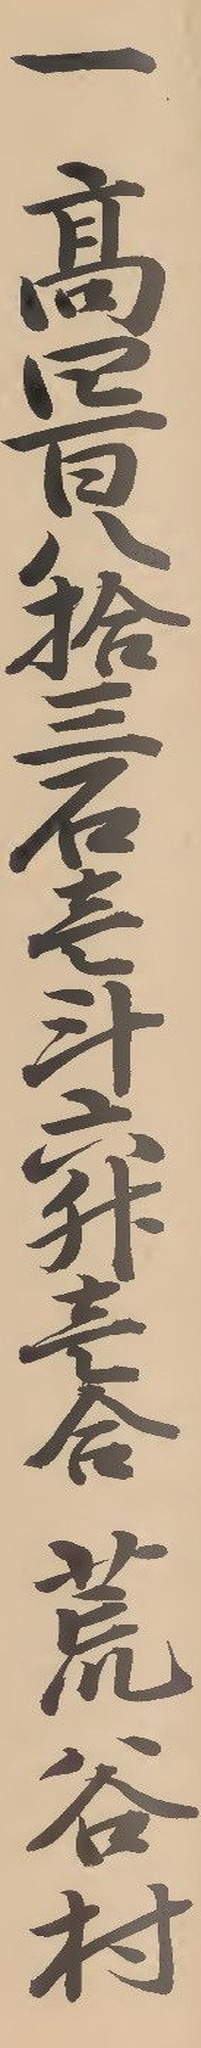一高四百八拾三石壱斗六升壱合荒谷村
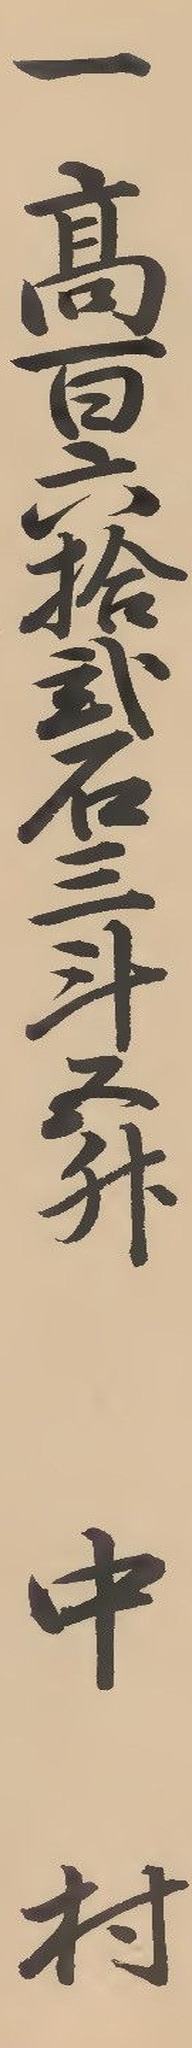一高百六拾弐石三斗五升中村
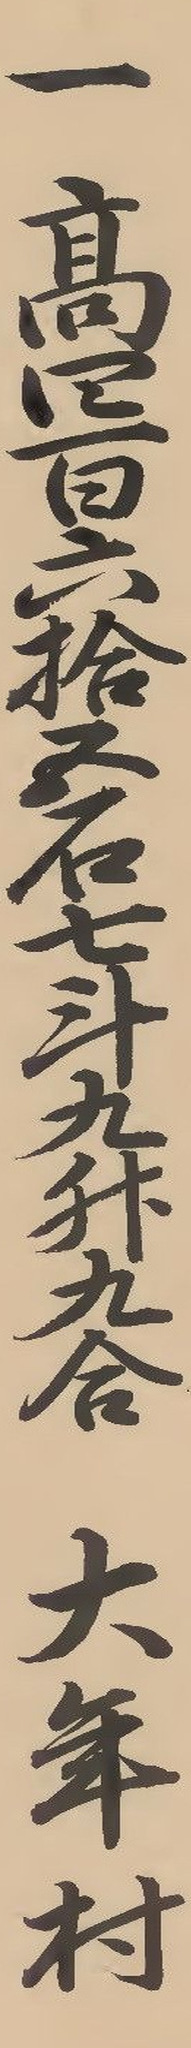一高四百六拾五石七斗九升九合大年村
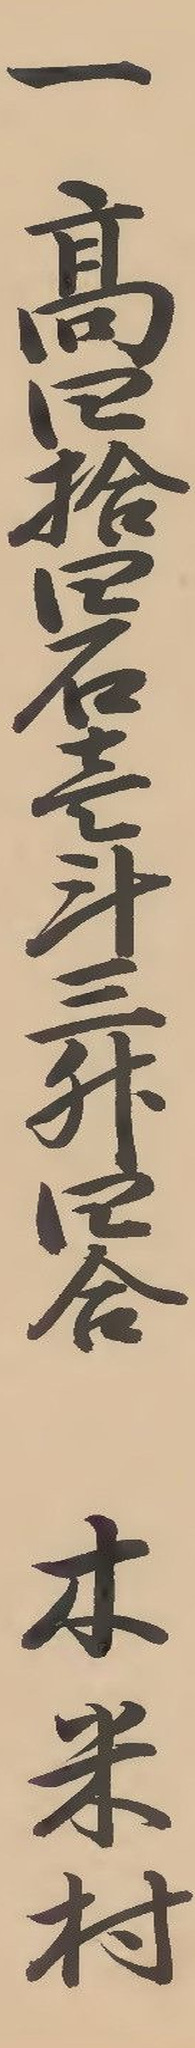一高四拾四石壱斗三升四合木米村

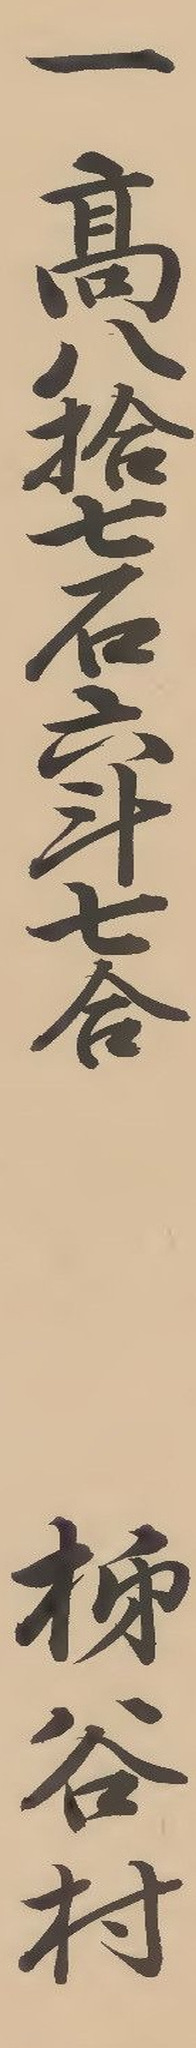一高八拾七石六斗七合柿谷村
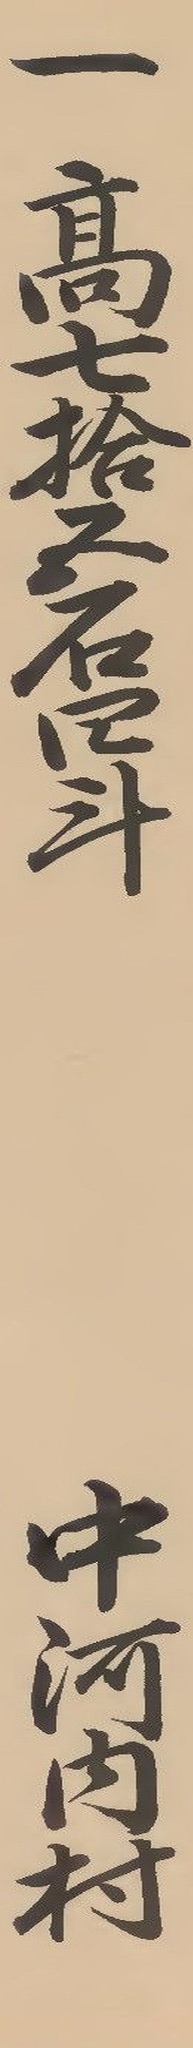一高七拾五石四斗中河内村
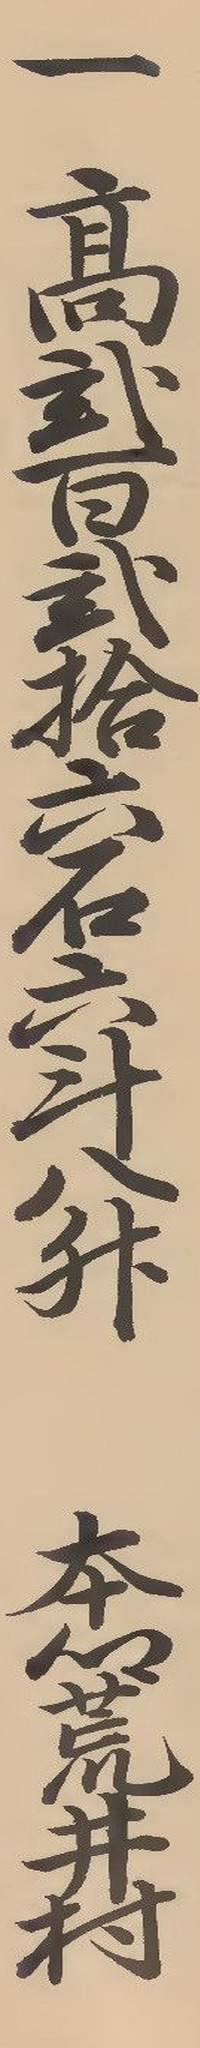一高弐百弐拾六石六斗八升本郷荒井村
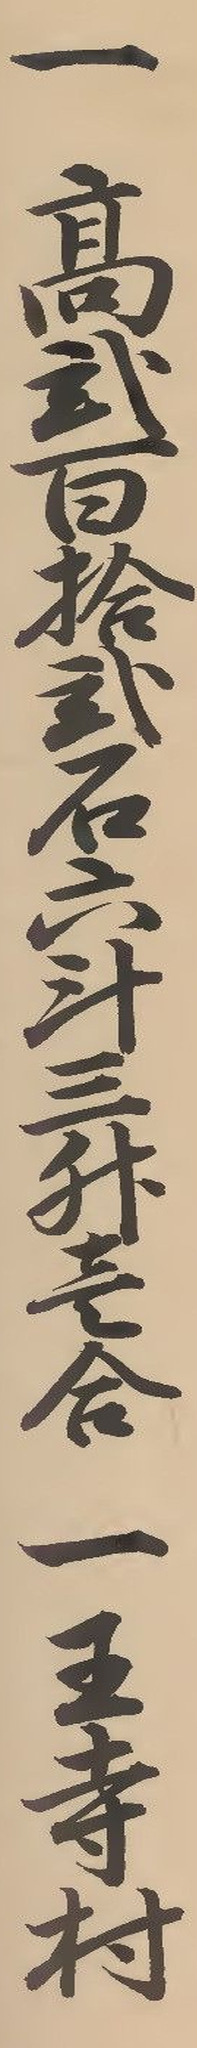一高弐百拾弐石六斗三升壱合一王寺村
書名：越前国郷帳
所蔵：国立公文書館 National Archives of Japan
